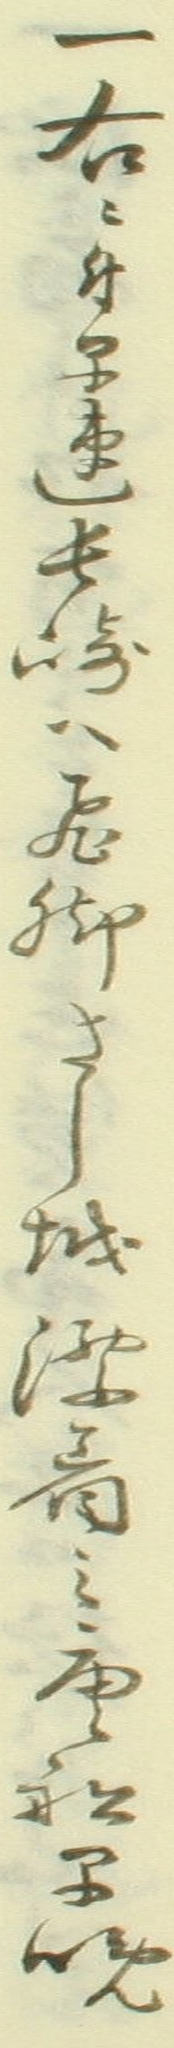一右に付早速長崎へ飛脚さし越漂着之唐船早晩
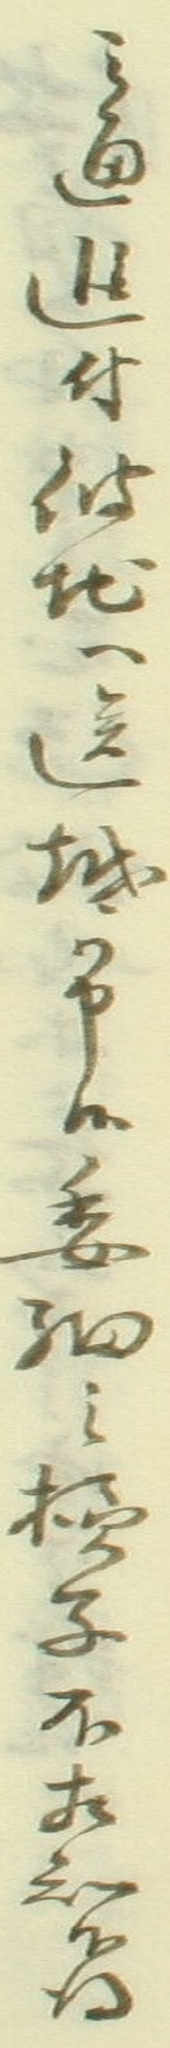之通追付彼地へ送越可申候委細の様子不相知候得
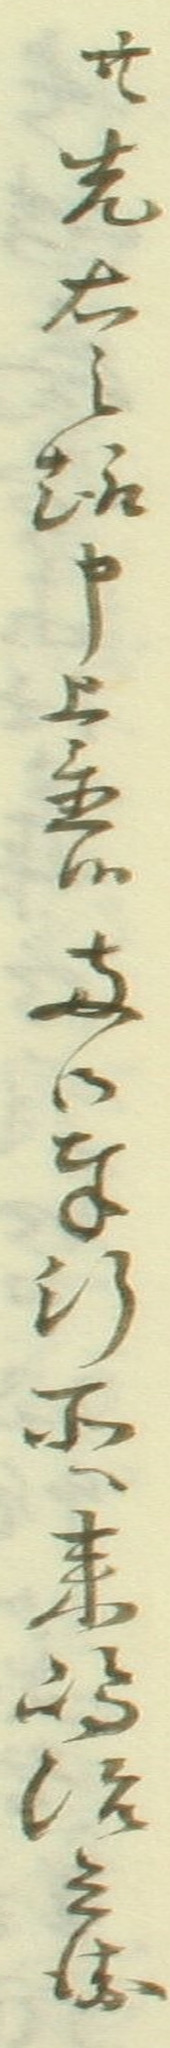共先右之趣申上置候両御奉行所へ来嶋治兵衛
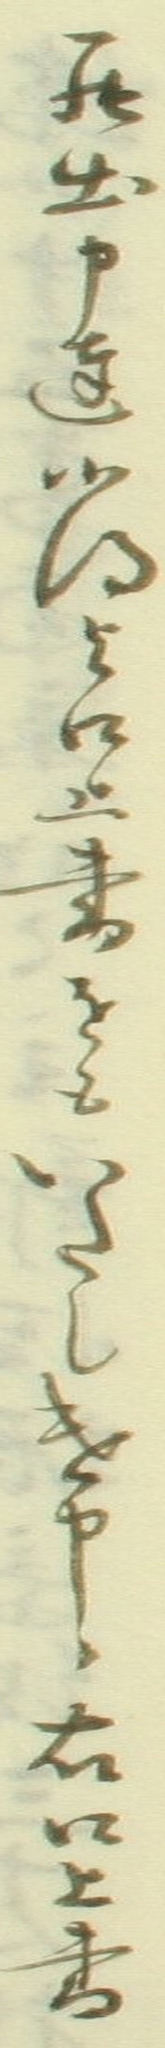罷出申達候得は口上書をもいたし遣申候右口上書
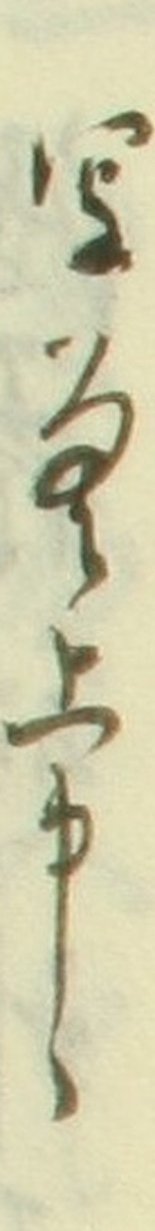写差上申候

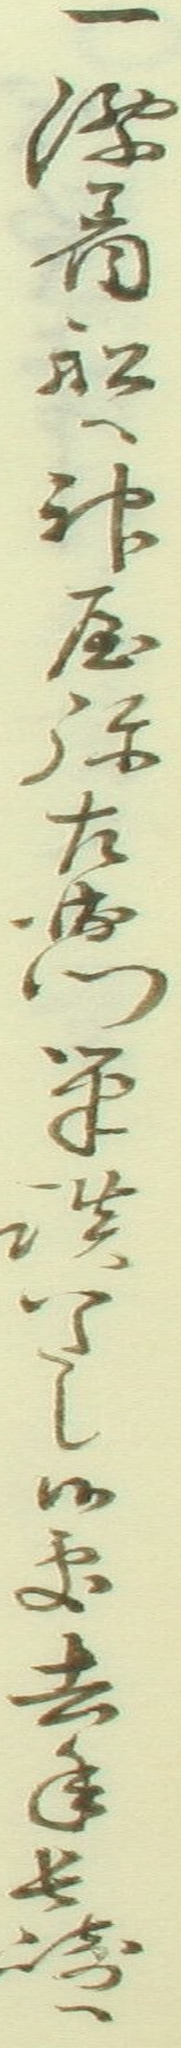一漂着船へ神屋弥左衛門筆談いたし候処去年長崎へ
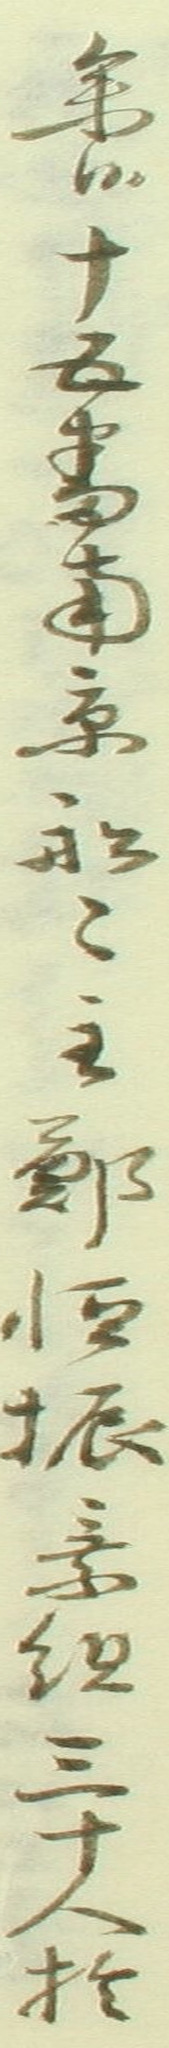参候十五番南京船々主鄭恒振乗組三十人於
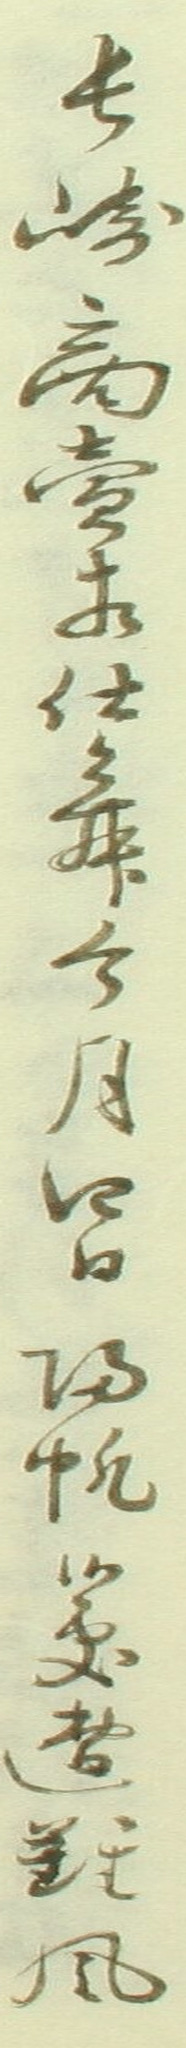長崎商売相仕舞今月四日帰帆候処遭難風
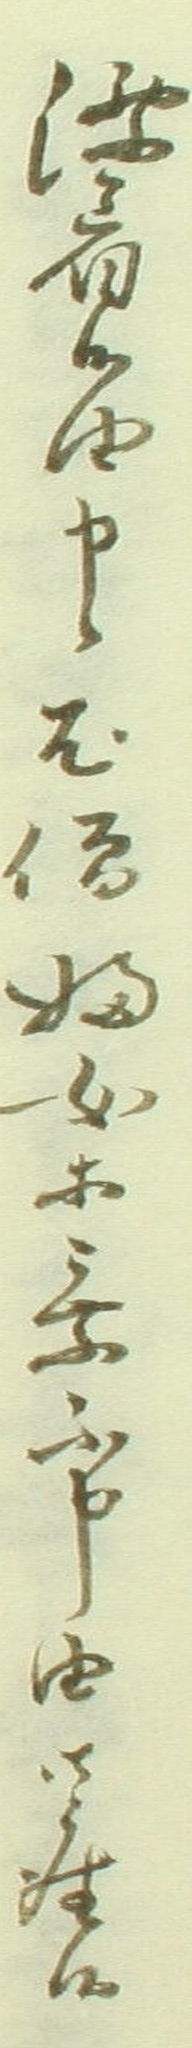漂着候由申候尤僧婦女等乗不申由御座候
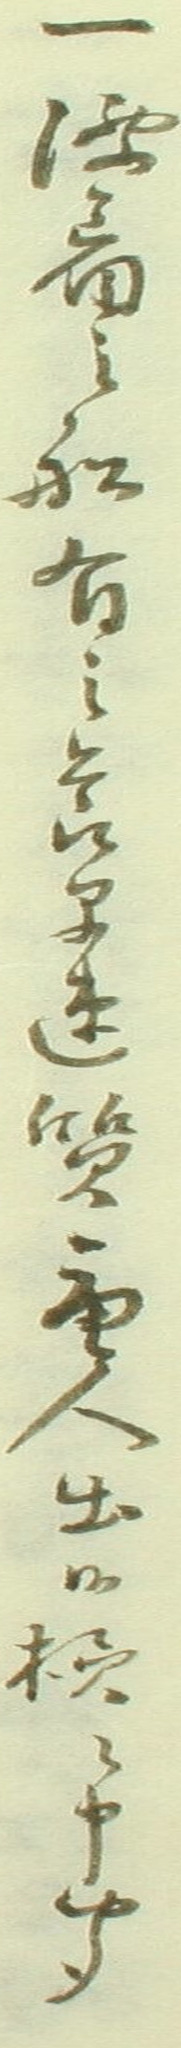一漂着之船有之節早速質唐人出候様被申聞
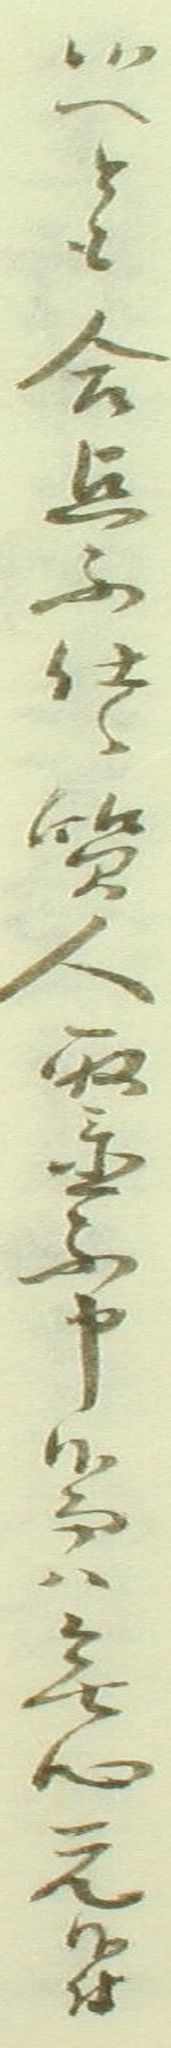候へとも合点不仕候質人取置不申候而は無心元候付
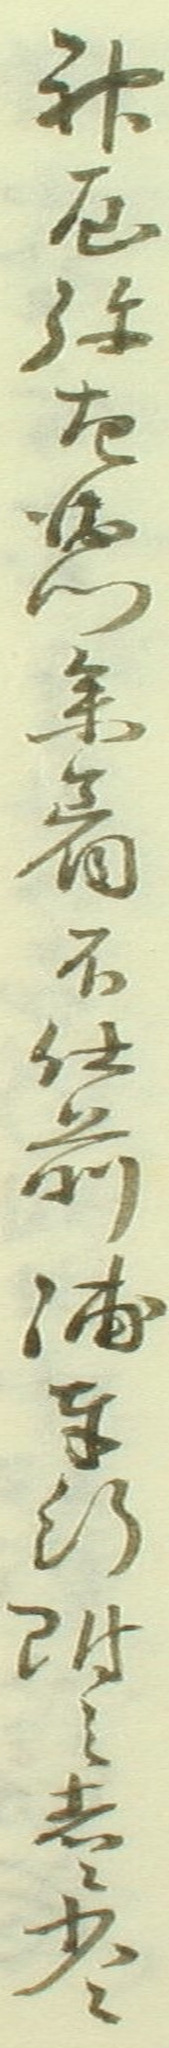神屋弥左衛門参着不仕前浦奉行附之者と少々
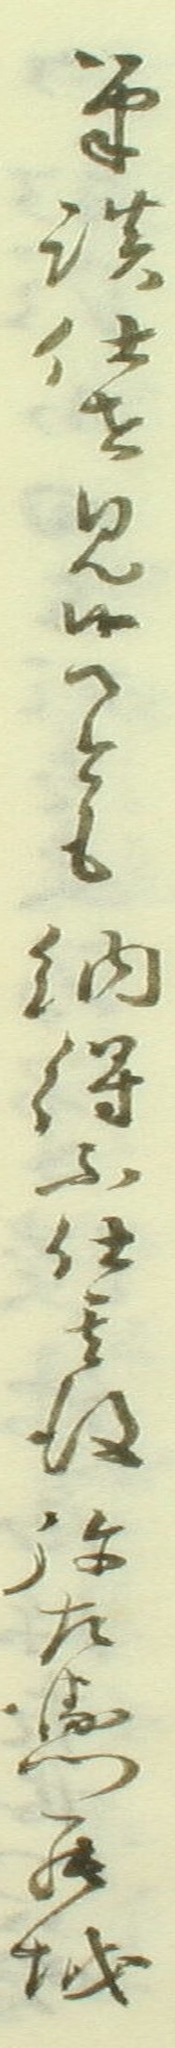筆談仕せ見候へとも納得不仕其後弥左衛門罷越
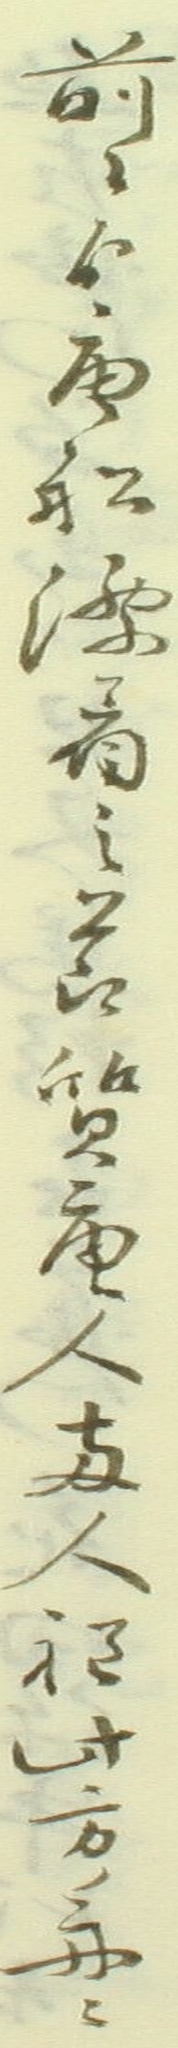前々ゟ唐船漂着之節質唐人両人程此方ノ舟に
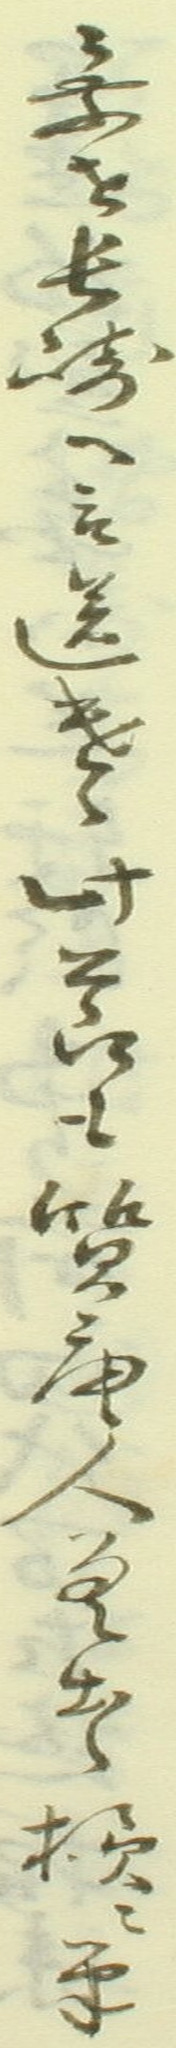乗せ長崎へ取送遣候此節も質唐人差出候様に筆
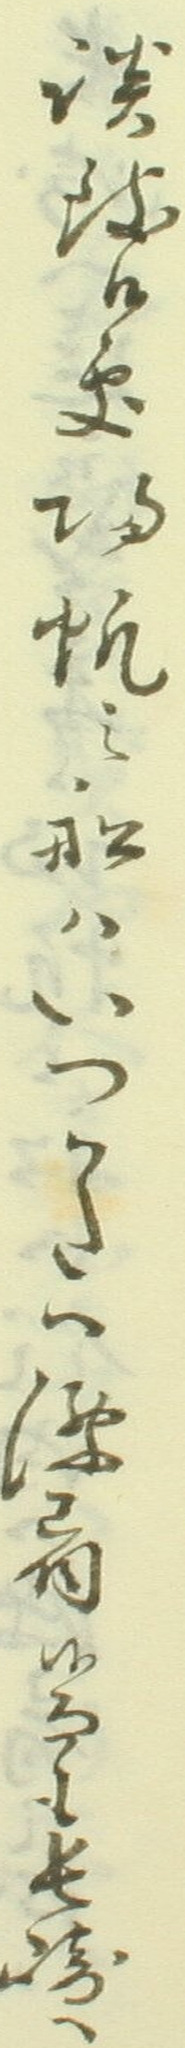談致候処帰帆之船はいつかたへ漂着候而も長崎へ
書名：異国船漂着記
